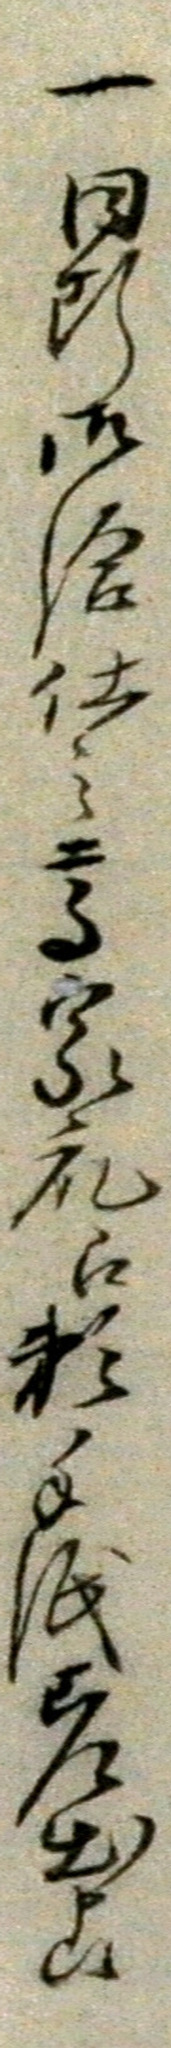一同断御給仕之高家衆え頼手紙差出申候
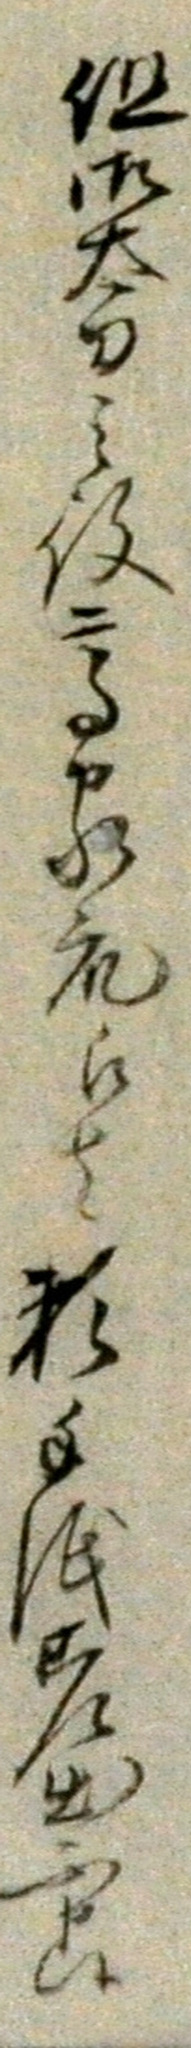但御太刀之役高家衆えは頼手紙差出不申候
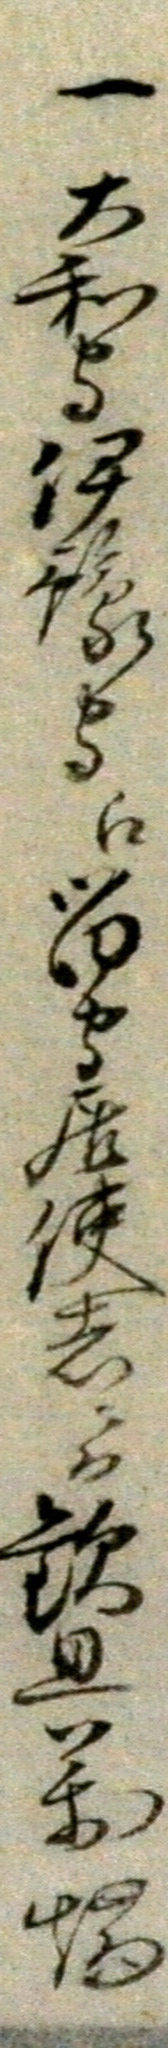一大和守伊豫守え留守居使者ニ而歓且万端
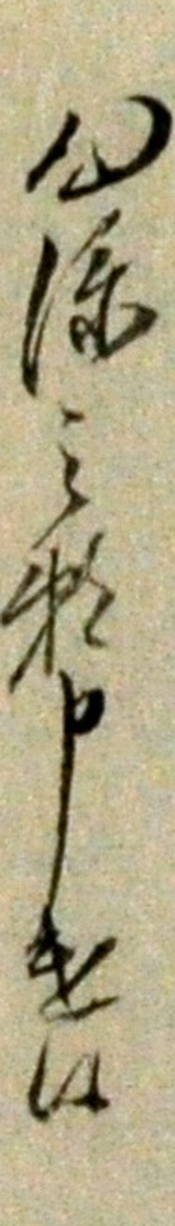心添之頼申遣候
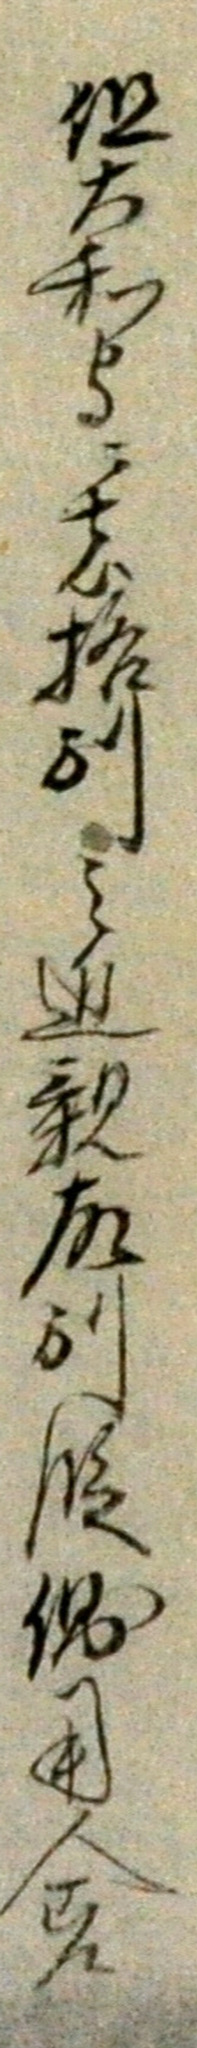但大和守ニは格別之近親故別段側用人差
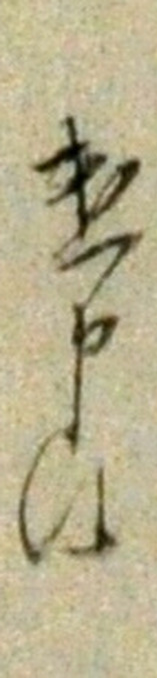遣申候
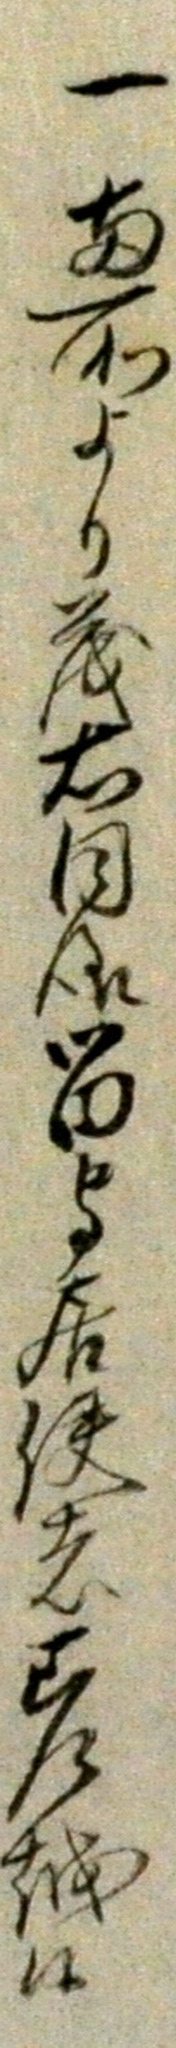一両所よりも右同様留守居使者差越候
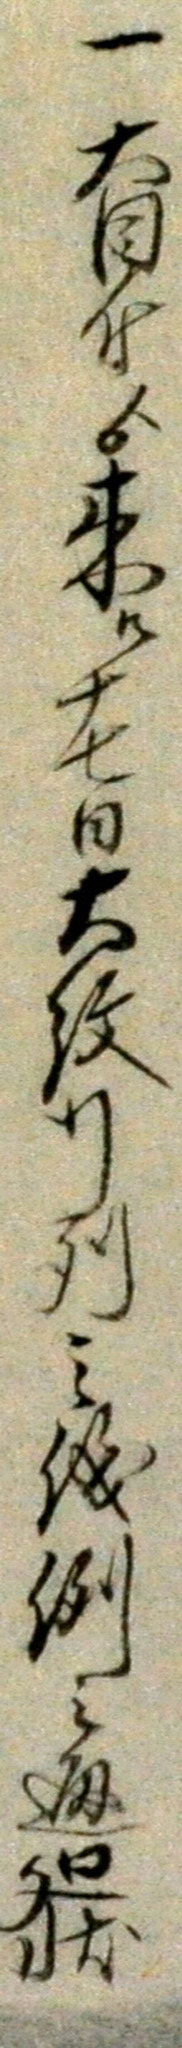一大目付ゟ来ル十七日大紋行列之儀例之通廻状
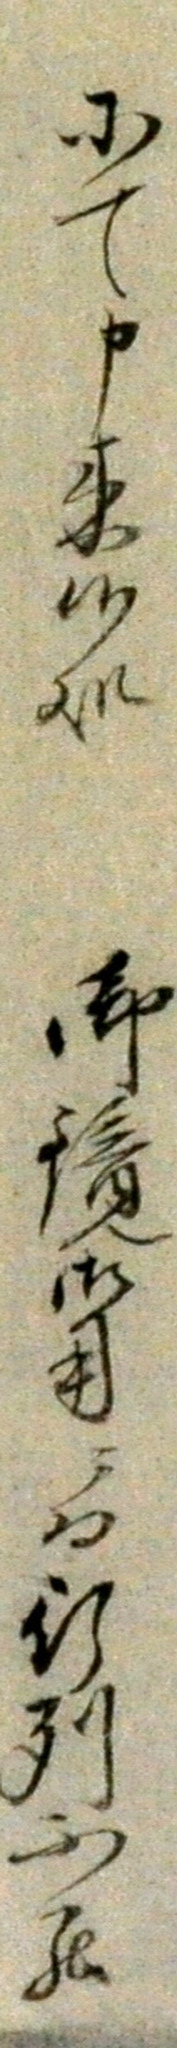にて申来候処御鏡御用ニ而行列不罷
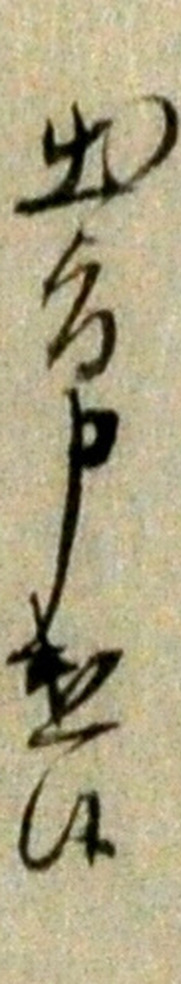出旨申遣候
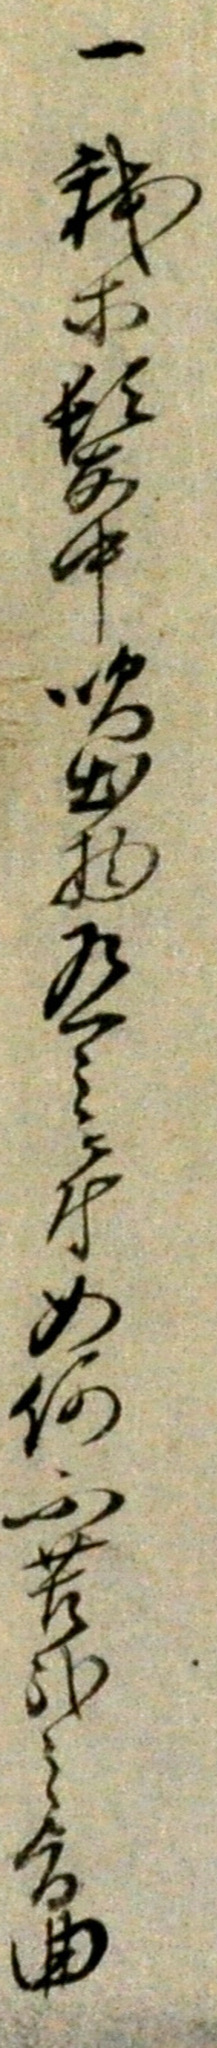一我等髪中吹出物有之ニ付如何不苦哉之旨曲
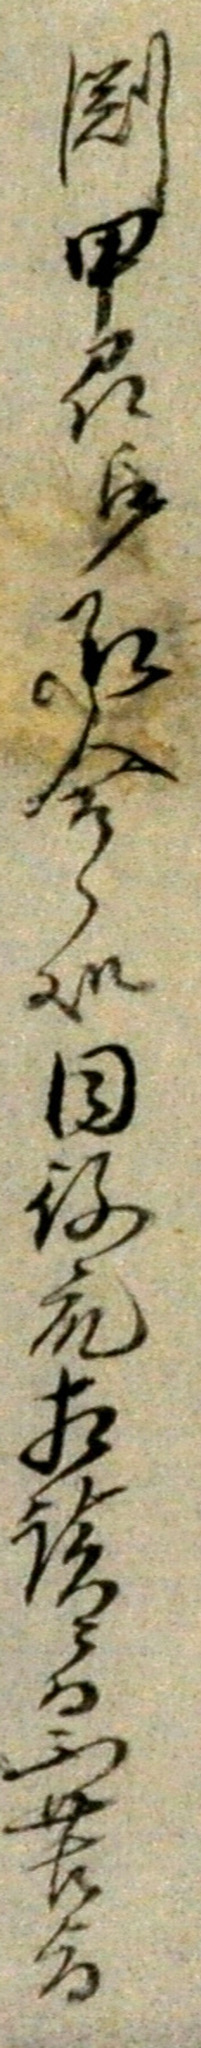渕甲州え承合候処同役衆相談ニ而不苦旨
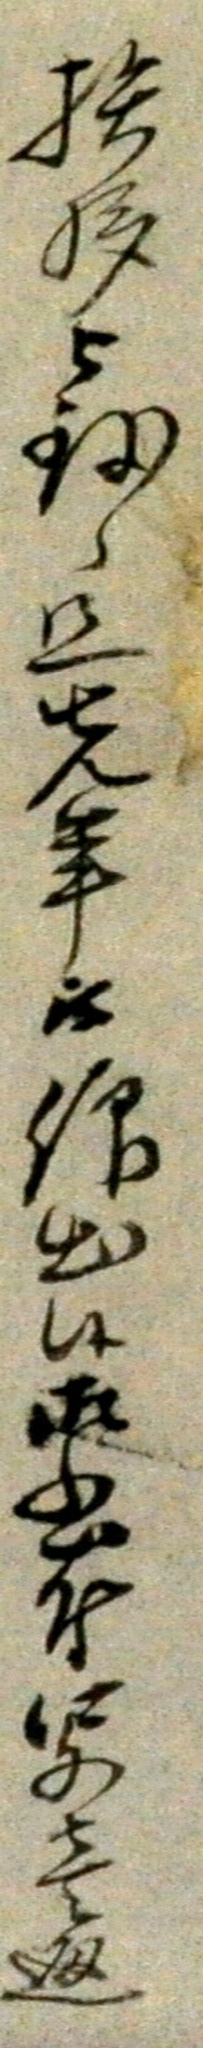挨拶被致候且先年被仰出候御書付写壱通
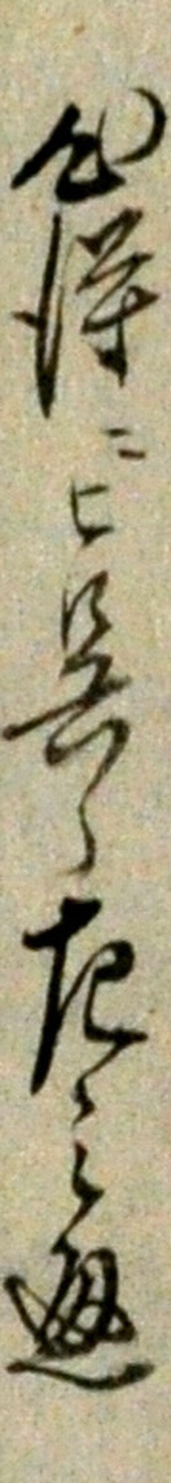心得ニ被呉候左之通
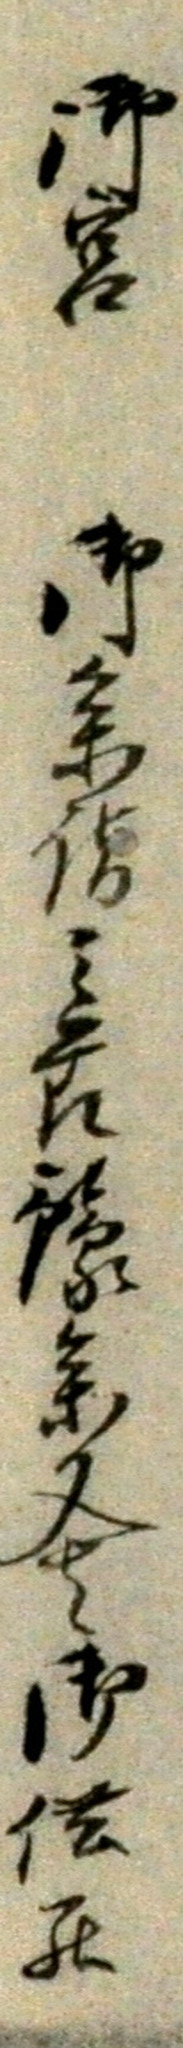御宮御参詣之節予参又は御供罷
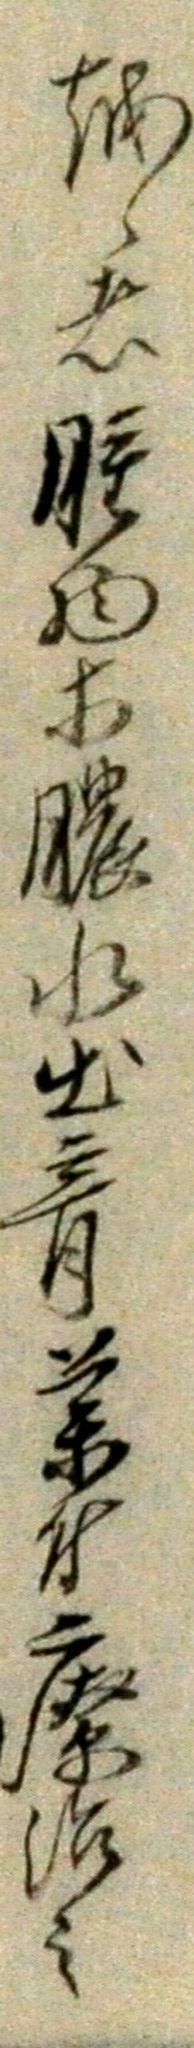越候者腫物等膿水出膏薬付療治之
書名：御鏡餅御用留（写）
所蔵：伊那市立高遠町図書館・合同会社AMANE
